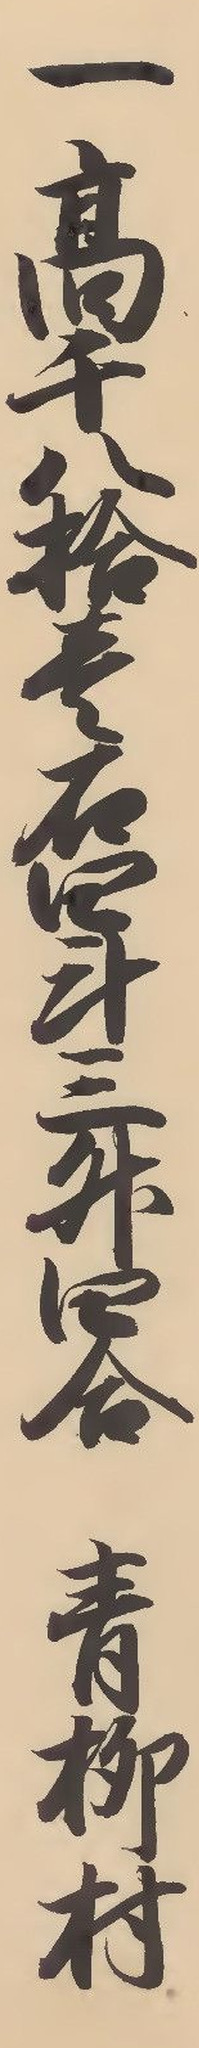一高千八拾壱石四斗三升四合青柳村
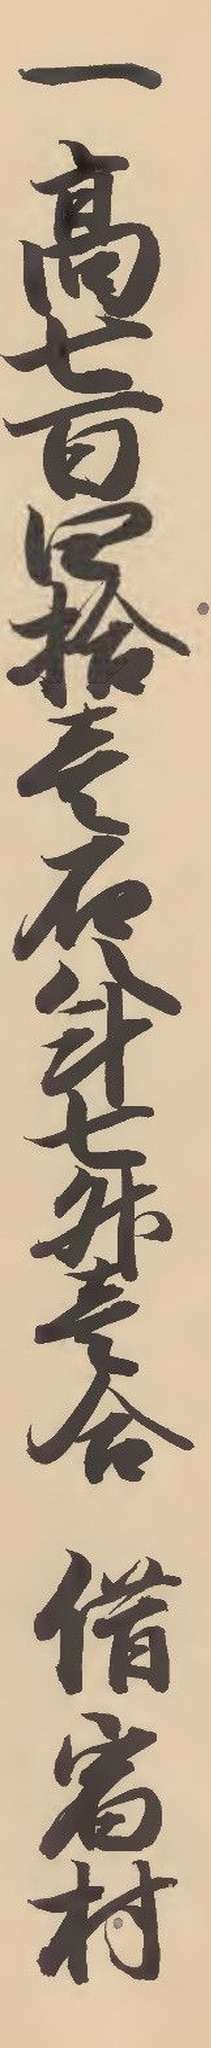一高七百四拾壱石八斗七升壱合借宿村
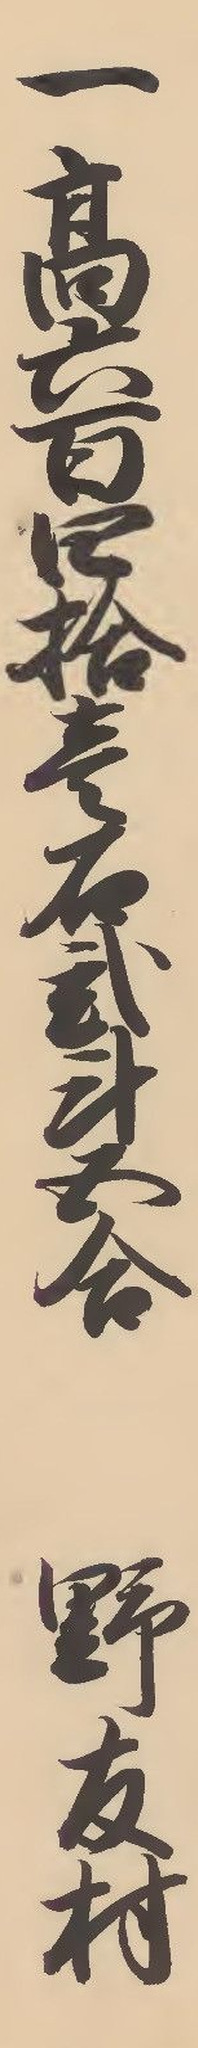一高六百四拾壱石弐斗五合野友村

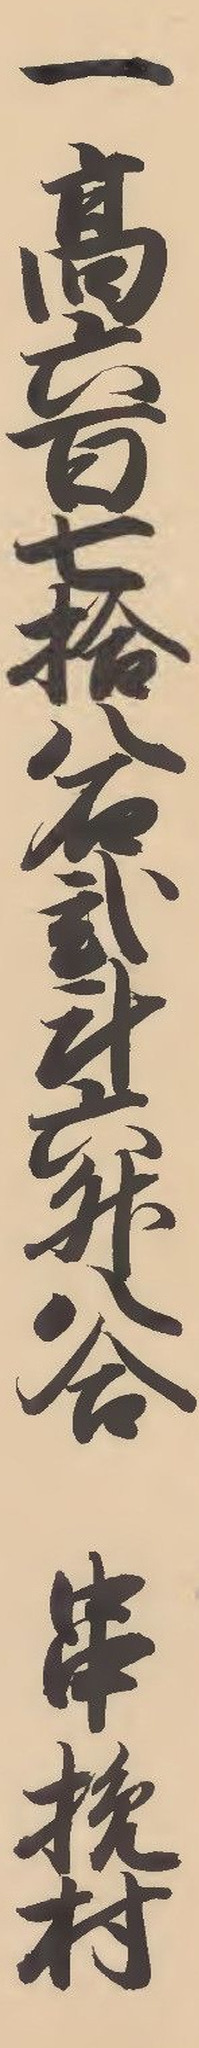一高六百七拾八石弐斗六升八合串挽村
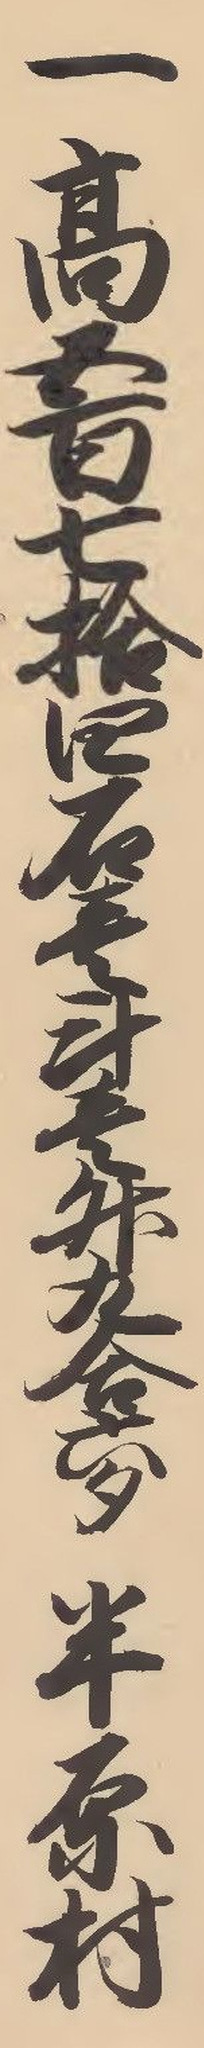一高五百七拾四石壱斗壱升九合六勺半原村
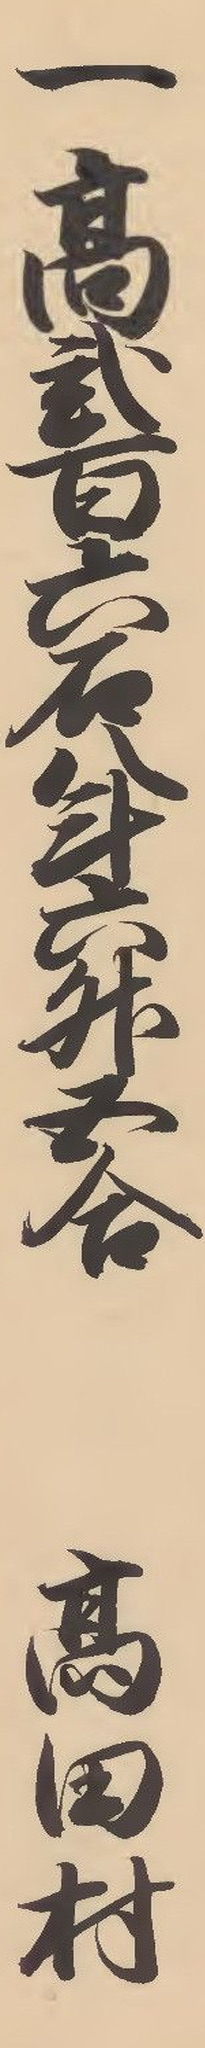一高弐百六石八斗六升五合高田村
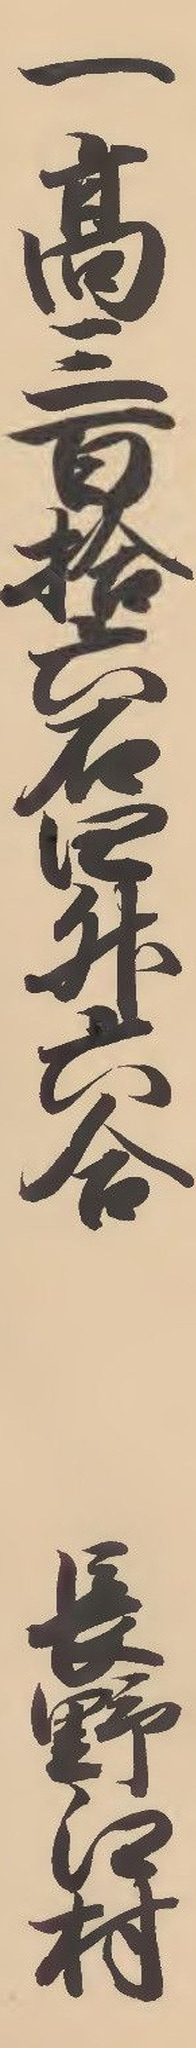一高三百拾六石四升六合長野江村
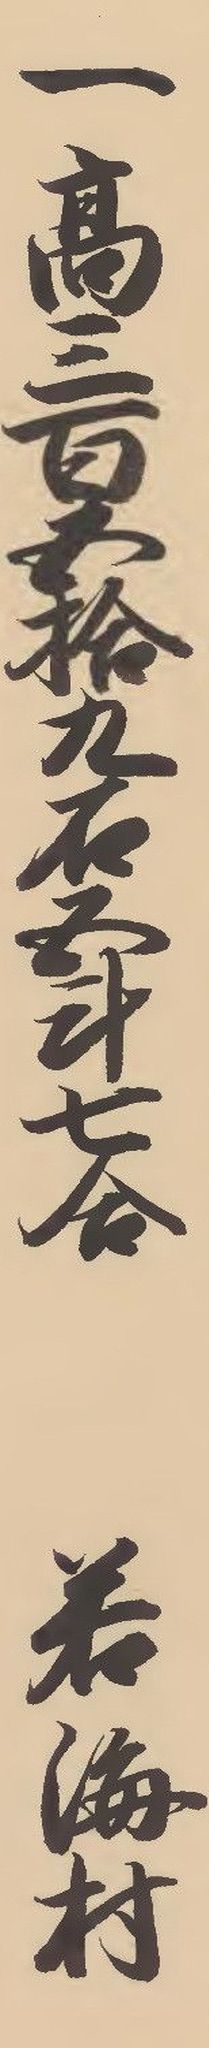一高三百五拾九石五斗七合若海村
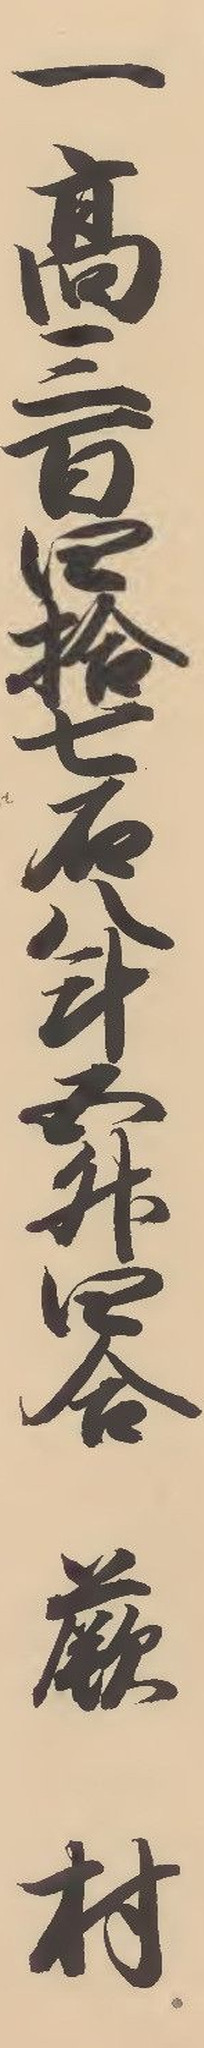一高三百四拾七石八斗五升四合蕨村
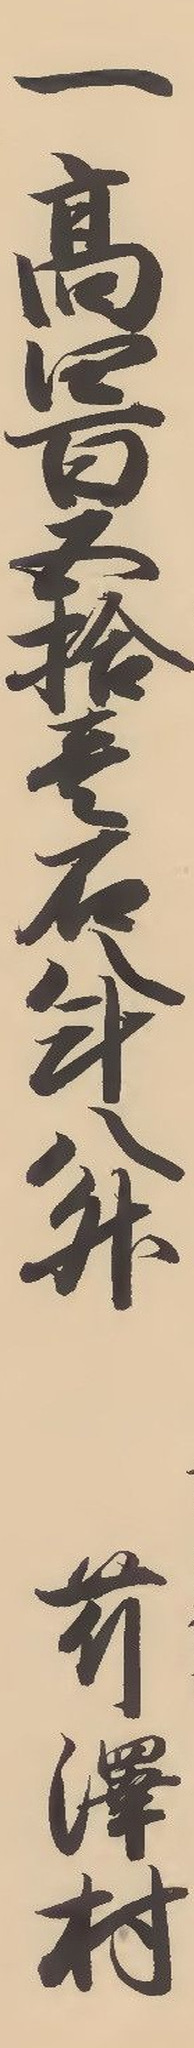一高四百五拾壱石八斗八升芹沢村
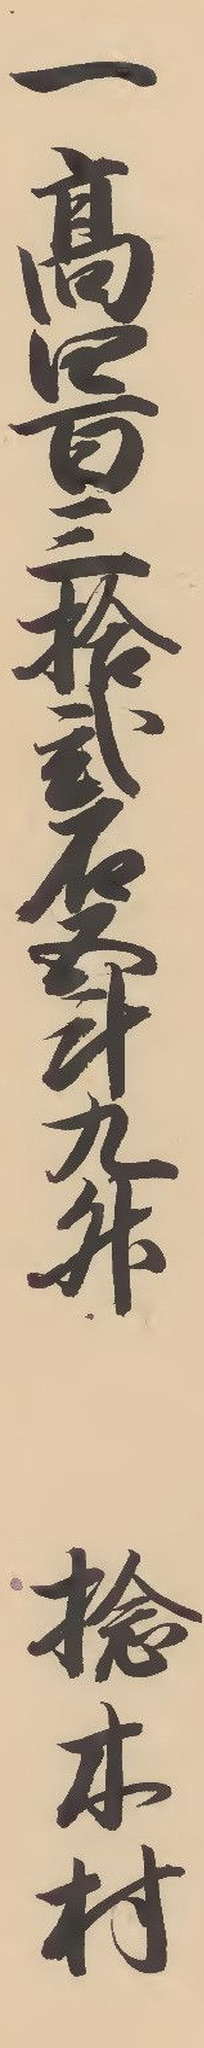一高四百三拾弐石五斗九升捻木村

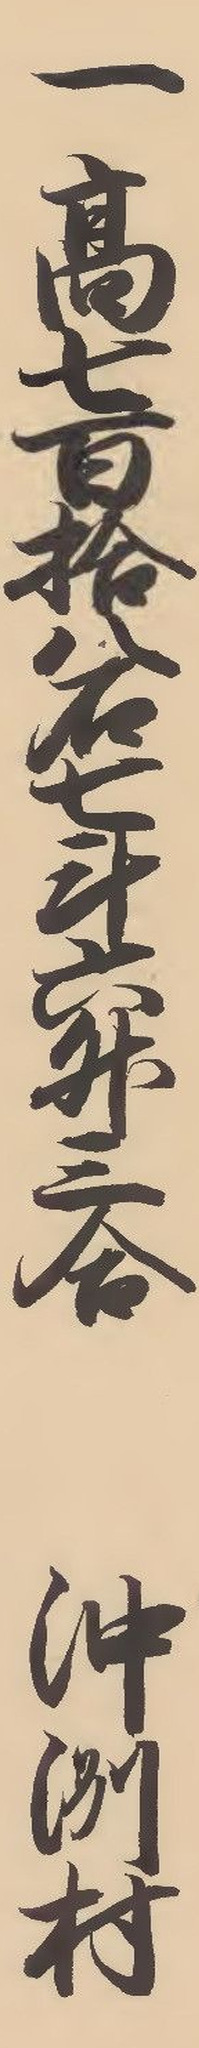一高七百拾八石七斗六升三合沖洲村
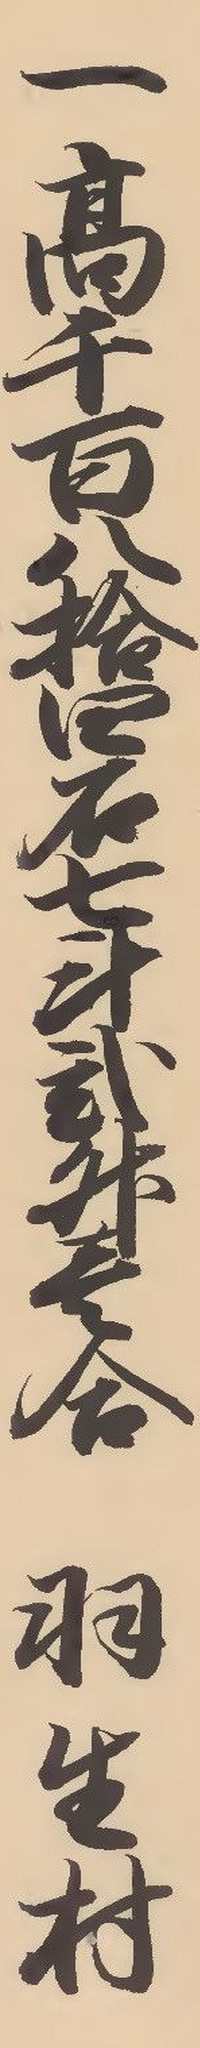一高千百八拾四石七斗弐升壱合羽生村
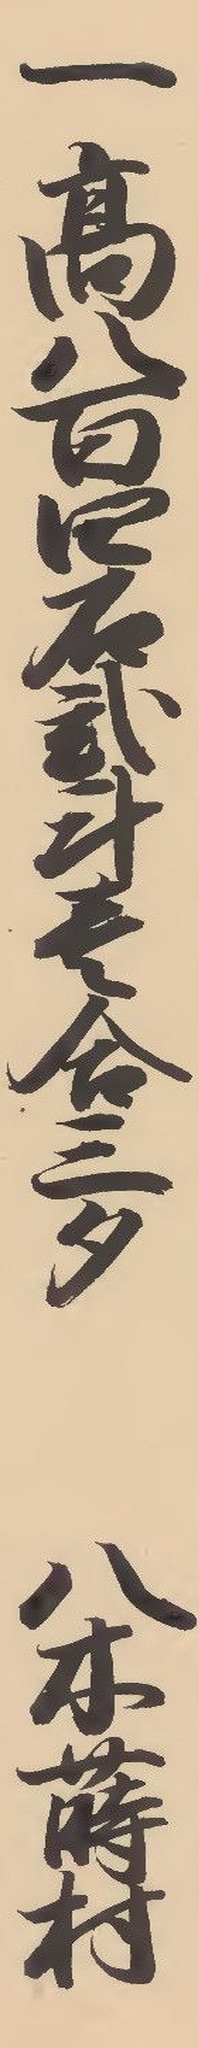一高八百四石弐斗壱合三勺八木蒔村
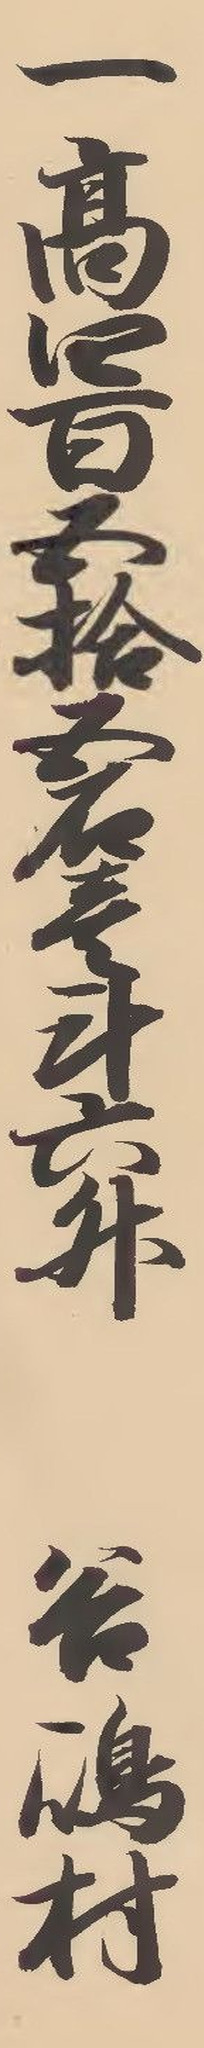一高四百五拾五石壱斗六升谷島村
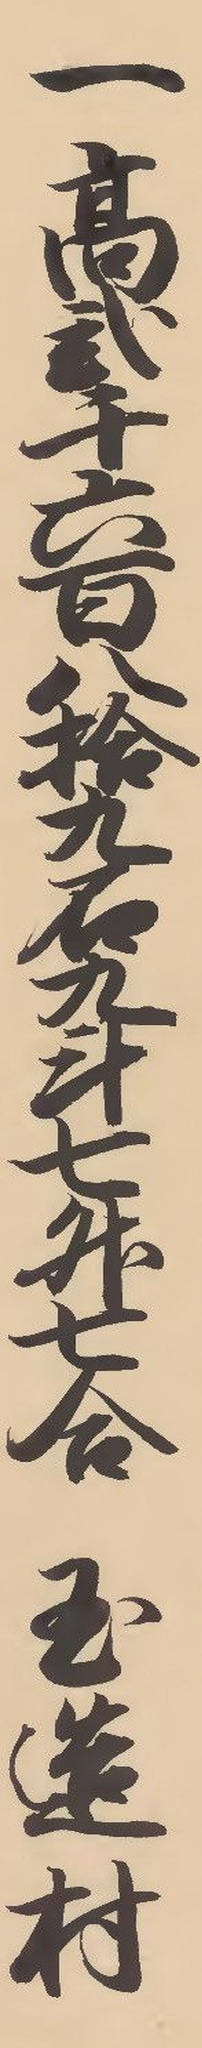一高弐千六百八拾九石九斗七升七合玉造村
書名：常陸国郷帳
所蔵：国立公文書館 National Archives of Japan
